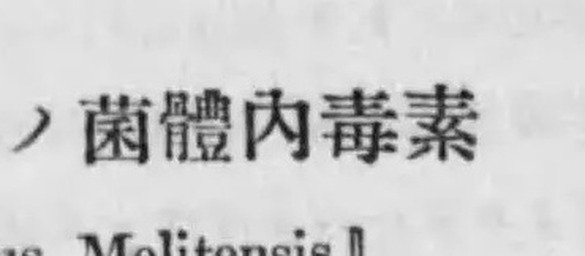の菌体内毒素
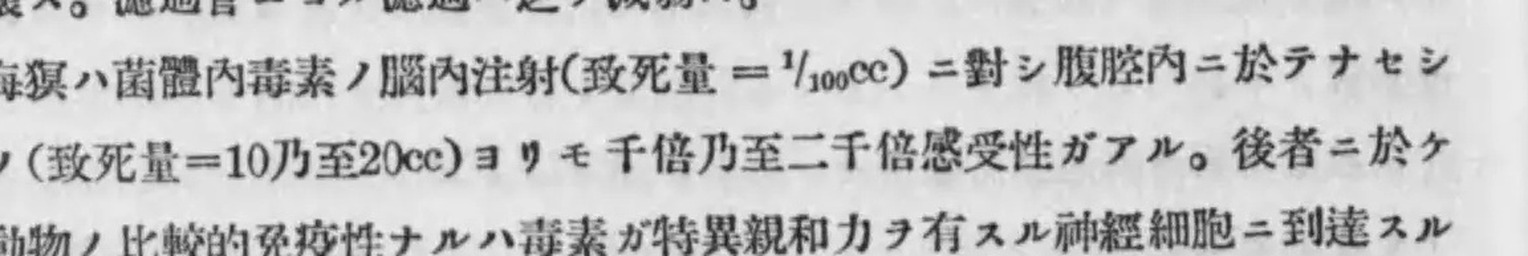もの(致死量＝乃至)よりも千倍乃至二千倍感受性がある。後者に於け

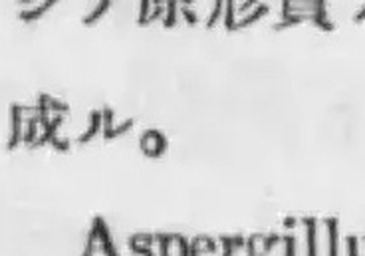成る。

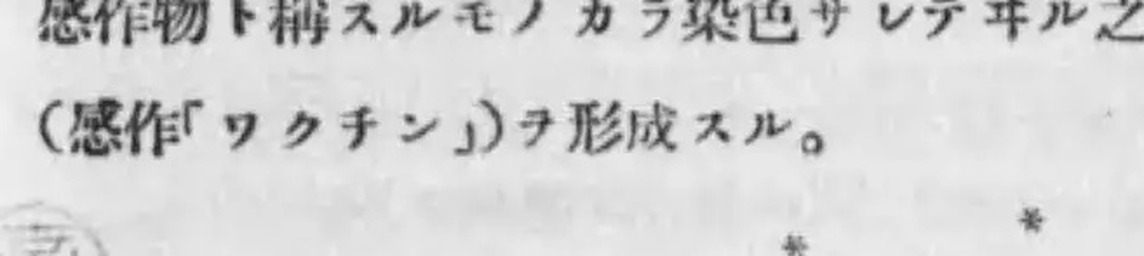(感作「ワクチン」)を形成する。
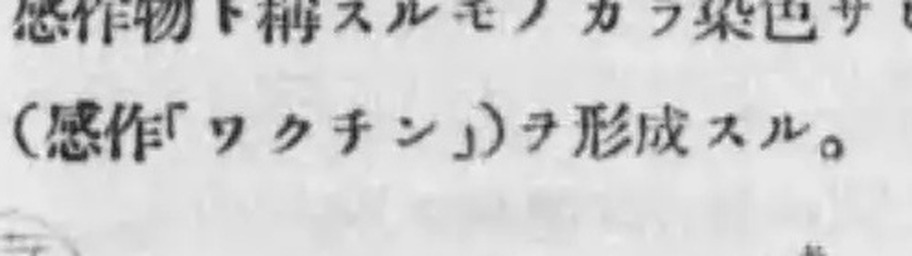(感作「ワクチン」)を形成する。
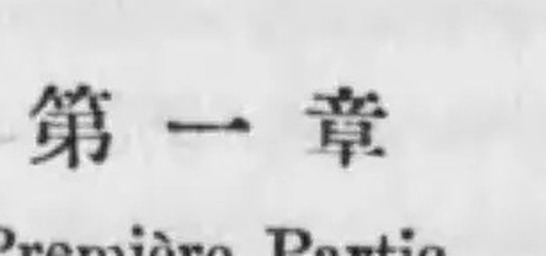第一章

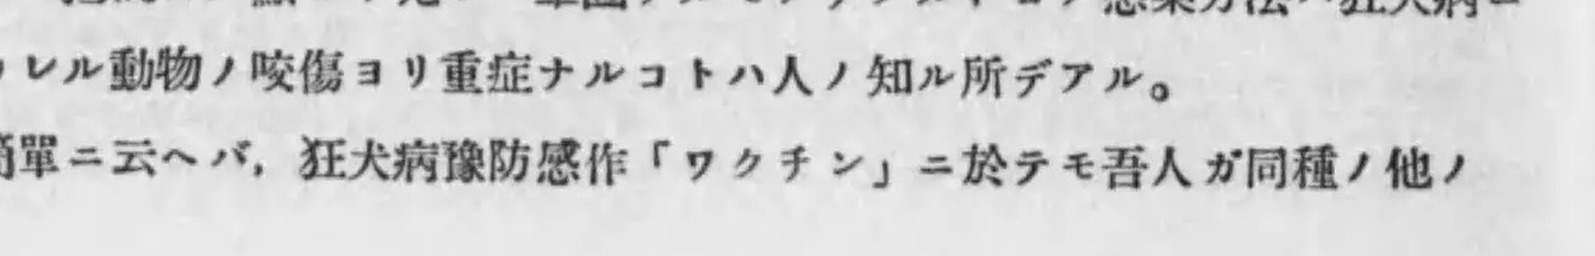簡単に云へば、狂犬病予防感作「ワクチン」に於ても吾人が同種の他の

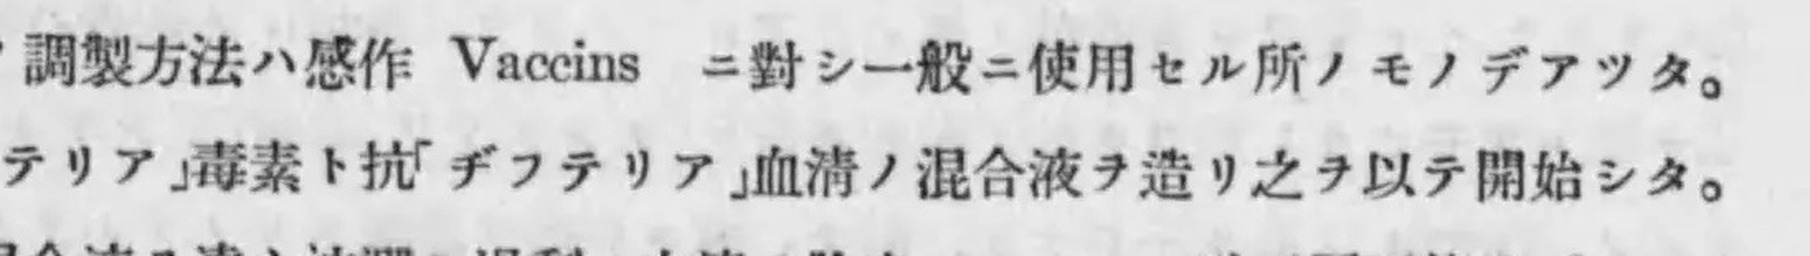「ヂフテリア」毒素を抗「ヂフテリア」血清の混合液を造り之を以て開始した。

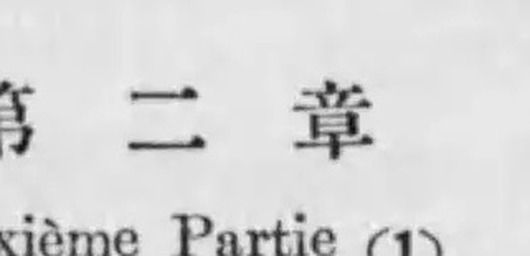第二章
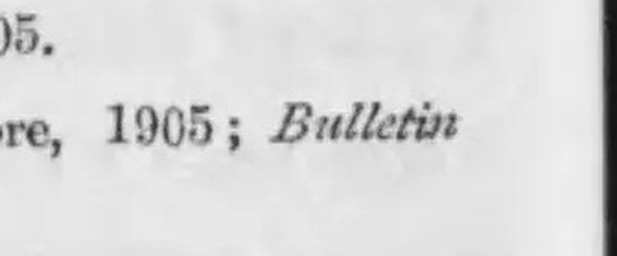,,,,,,,,;,
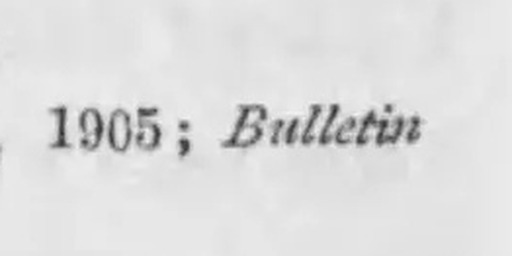,,,,,,,,;,
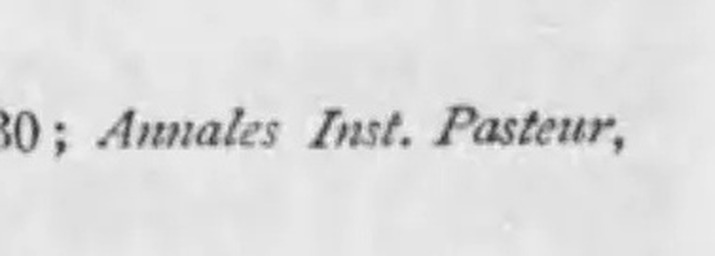,,,,,,,,;,
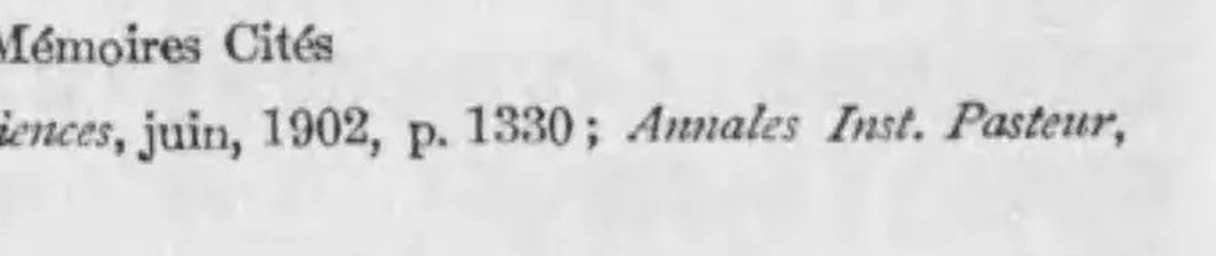,,,,,,,,;,
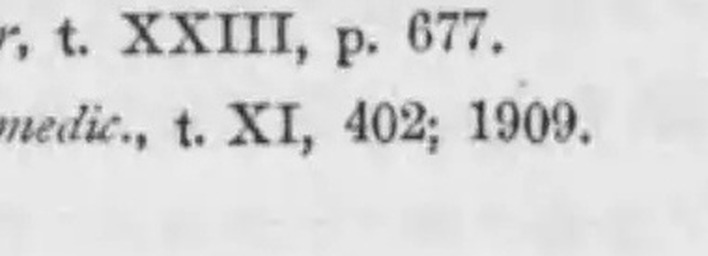,,,,,,,,;,
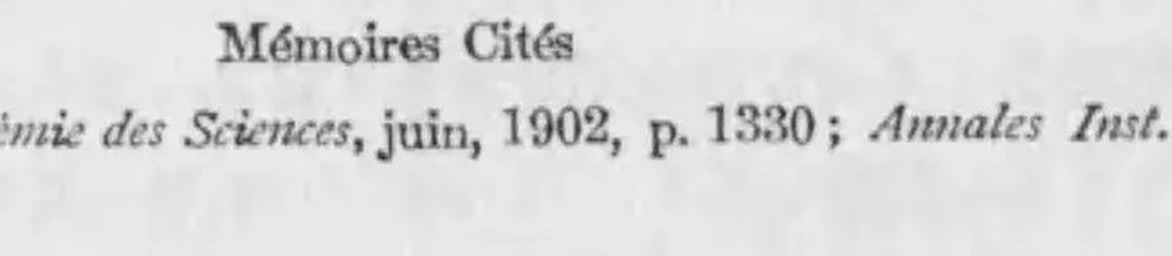,,,,,,,,;,
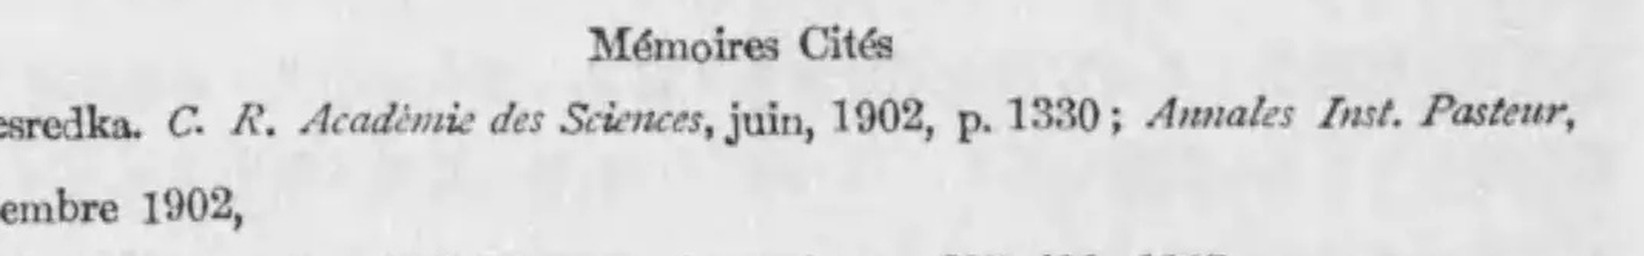,,,,,,,,;,
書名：伝染病ニ於ケル免疫ニ関スル研究
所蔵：国立国会図書館 National Diet Library, JAPAN
